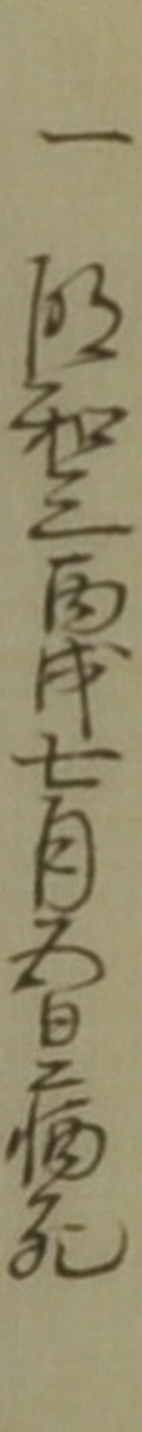一明和三丙戌七月五日病死
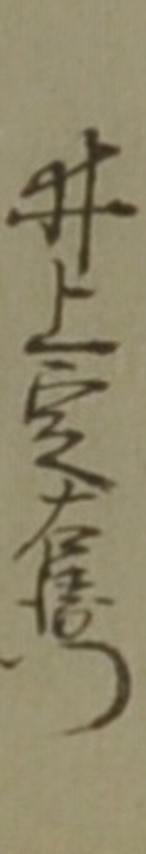井上定右衛門
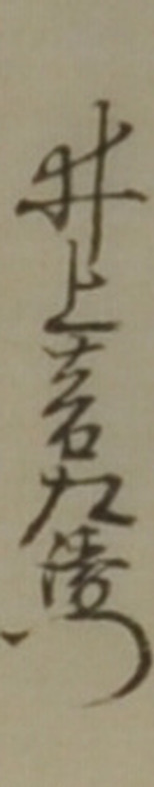井上音左衛門

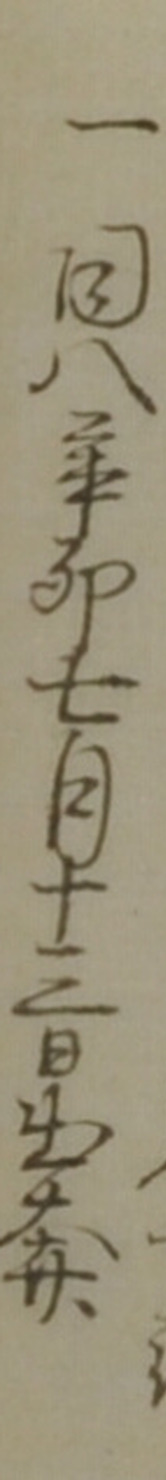一同八辛卯七月十三日出奔
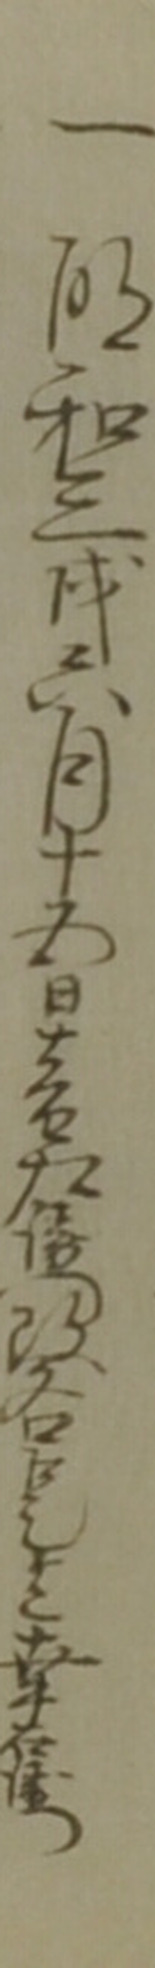一明和三戌六月十五日音左衛門改名是迄幸右衛門
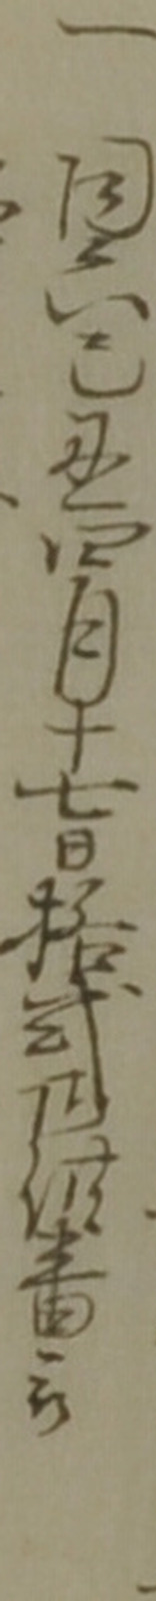一同六己丑四月十七日格式御供番被
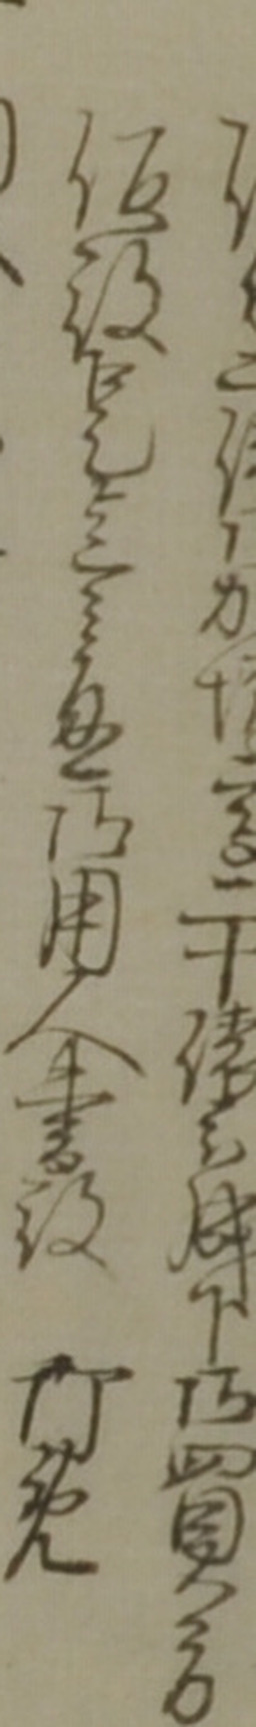仮役是迄之通御用人書役御免
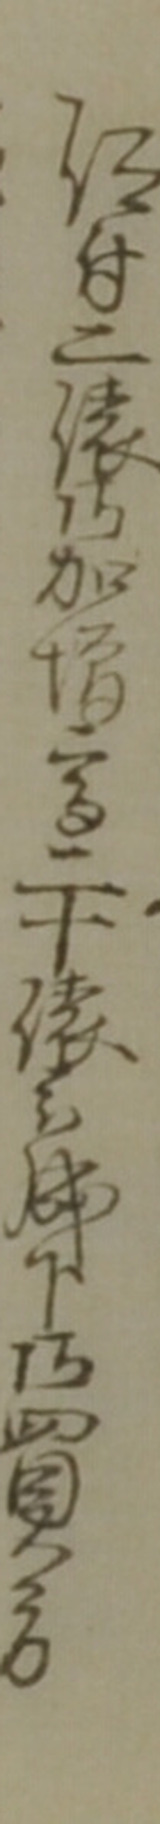仰付二俵御加増高二十俵被成下御買方
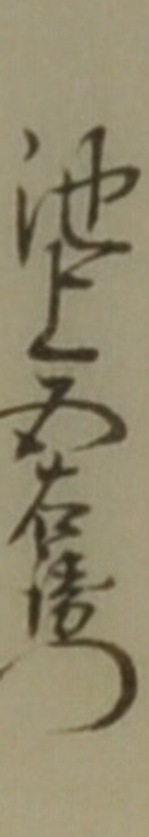池上五右衛門

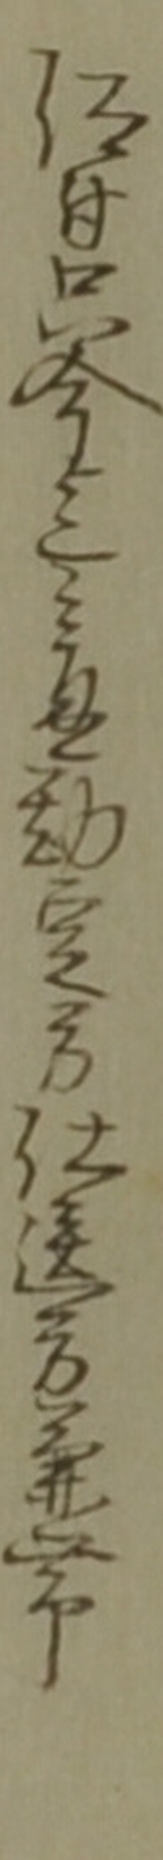仰付只今迄之通勘定方仕送方兼帯
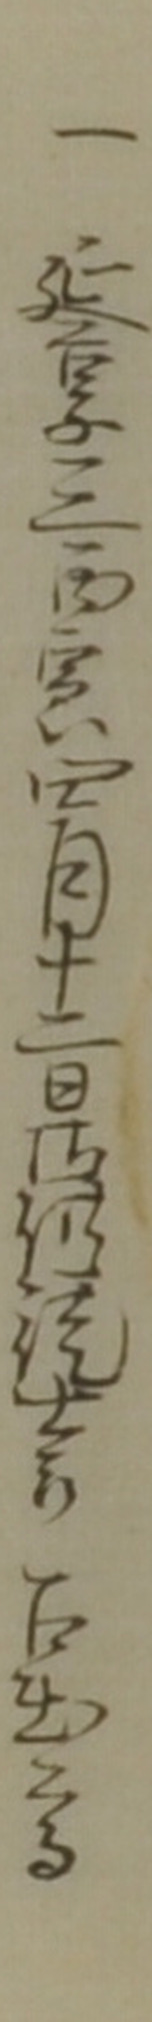一延享三丙寅四月十二日御供徒士被召出高
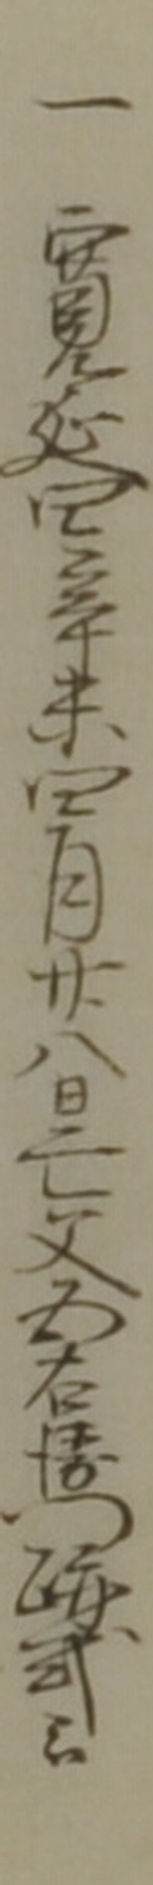一寛延四辛未四月廿八日亡父五右衛門跡式被
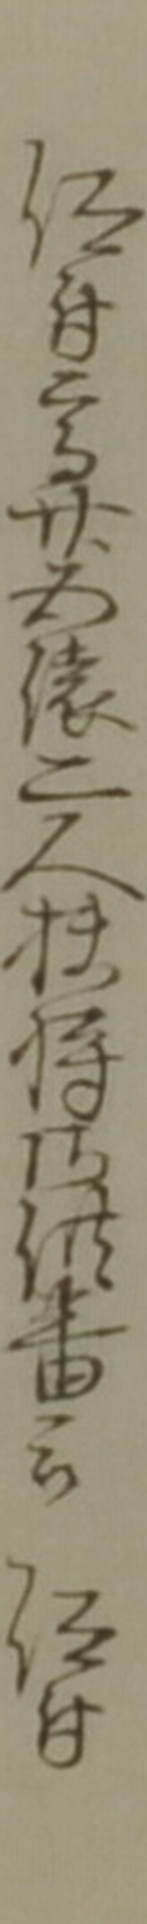仰付高廿五俵二人扶持御供番被仰付
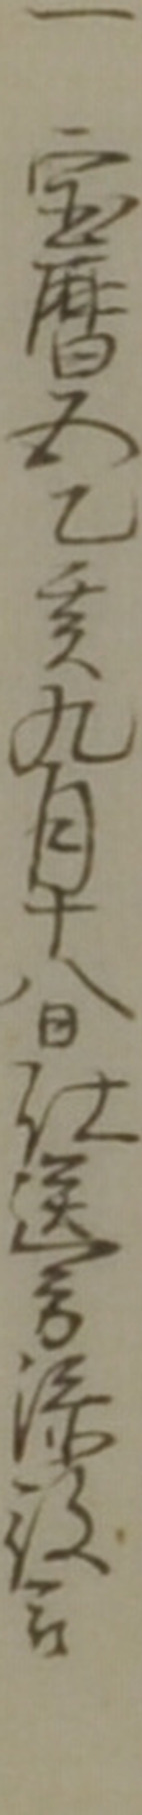一宝暦五乙亥九月十八日仕送方添役被
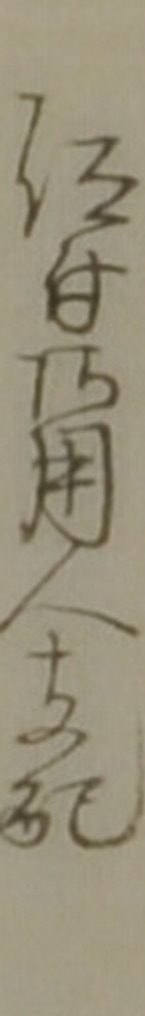仰付御用人支配
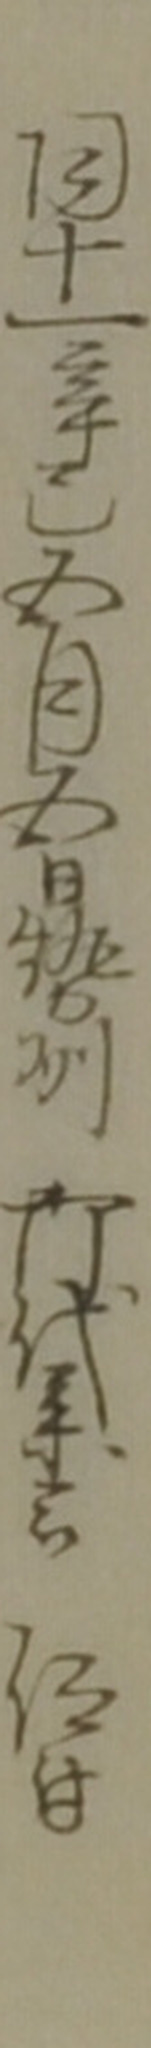一同十一辛巳五月五日勢州御代参被仰付
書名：無足廃家（弐）
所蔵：伊那市立高遠町図書館・合同会社AMANE
